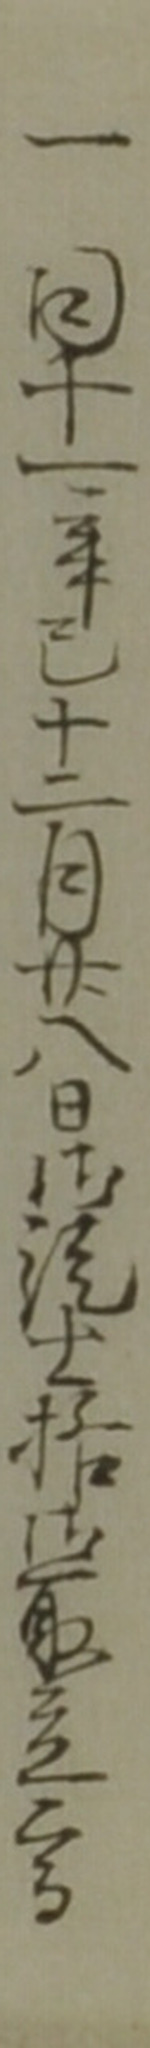一同十一辛巳年十二月廿八日御徒士格御取立高
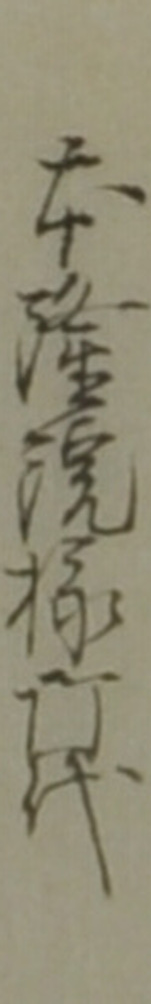本隆院様御代
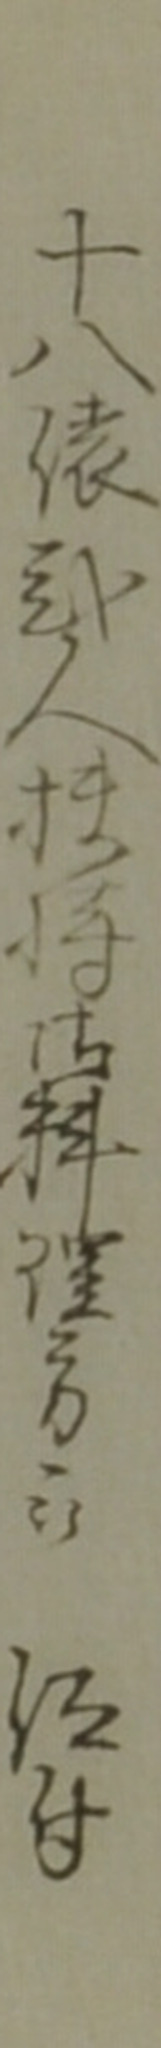十八俵弐人扶持御料理方被仰付
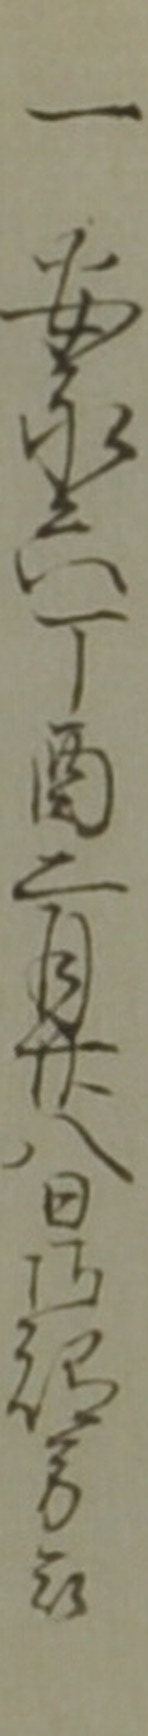一安永六丁酉二月廿八日御賄方被
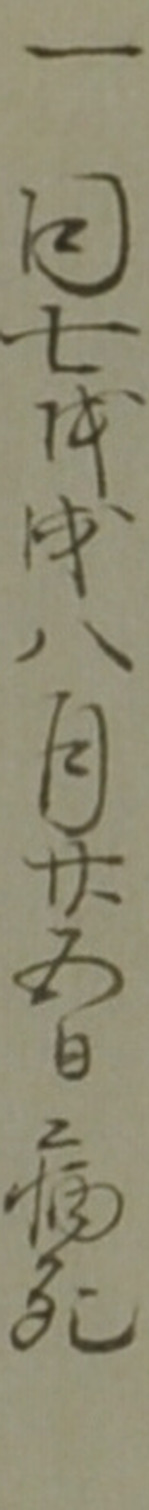一同七戌戌八月廿五日病死
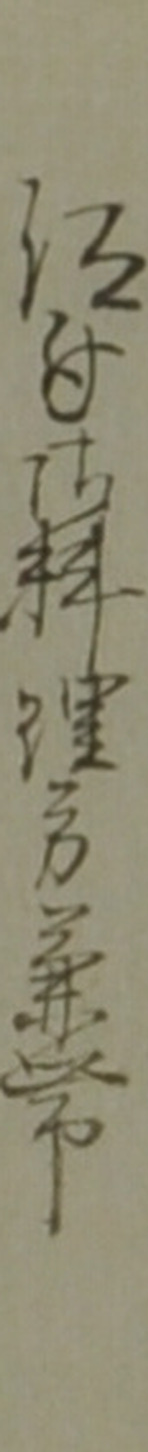仰付御料理方兼帯
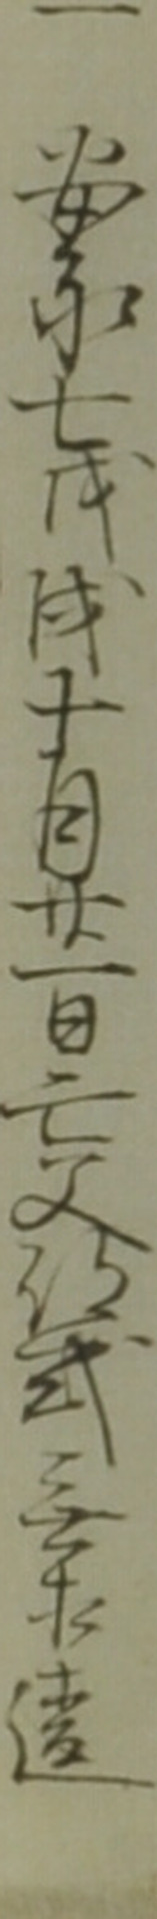一安永七戌戌十月廿一日亡父跡式無相違
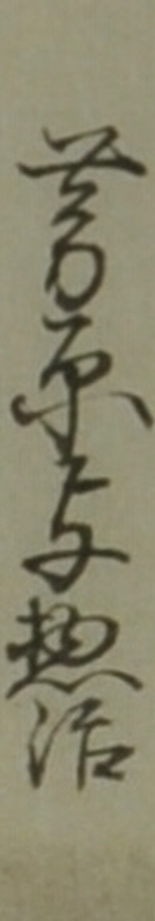芳原与惣治
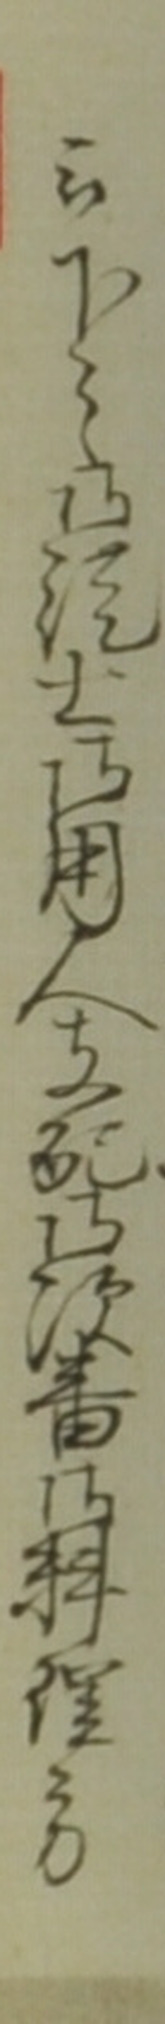被下之御徒士御用人支配御次番御料理方

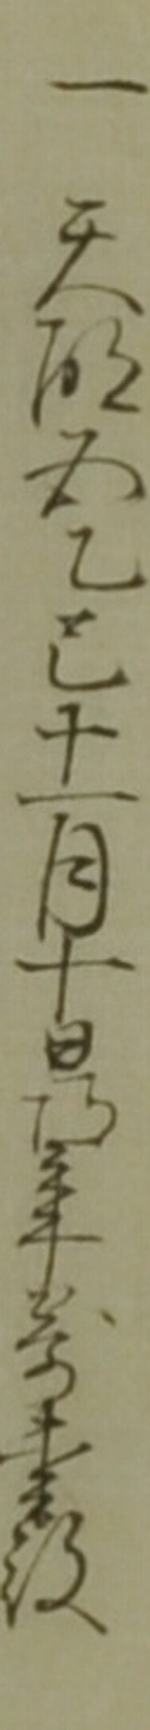一天明五乙巳十一月十日御年寄書役
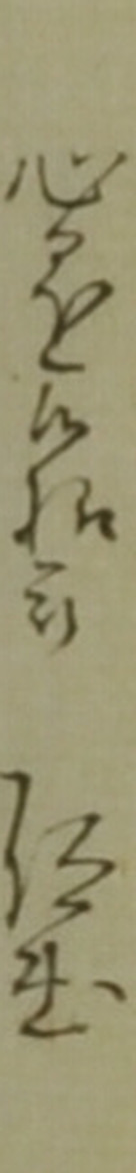心遠候様被仰出
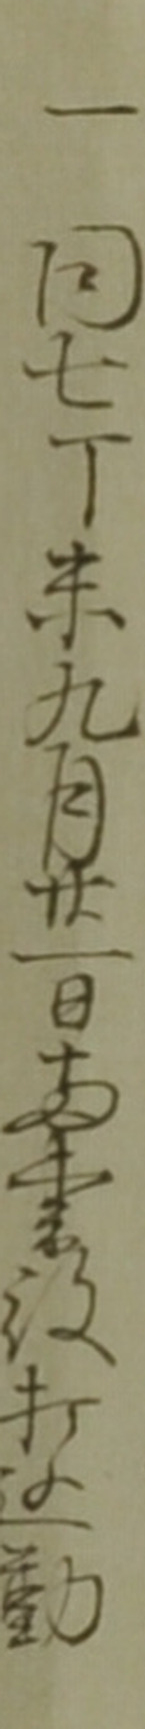一同七丁未九月廿一日両書役打込勤
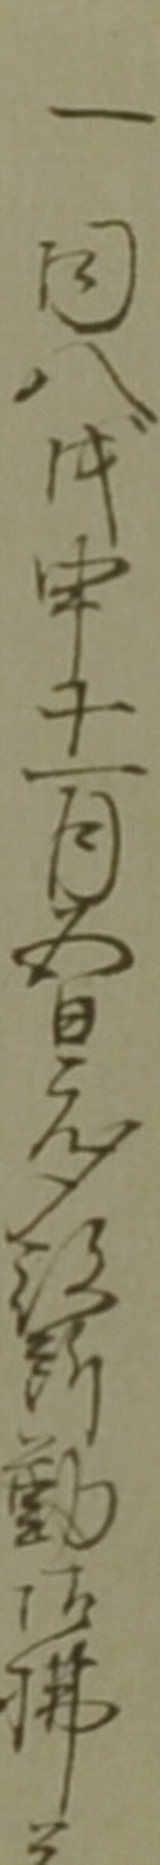一同八戌申十一月五日元〆役所勤御掛
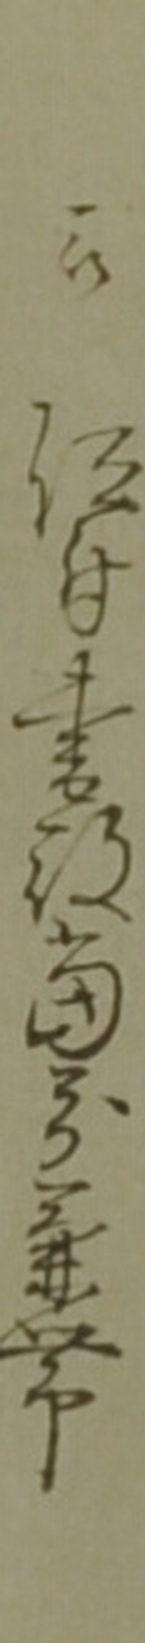被仰付書役当分兼帯
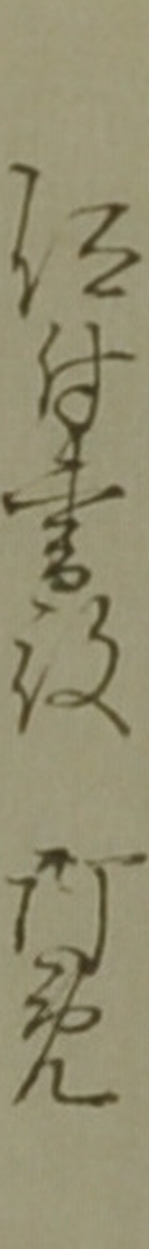仰付書役御免
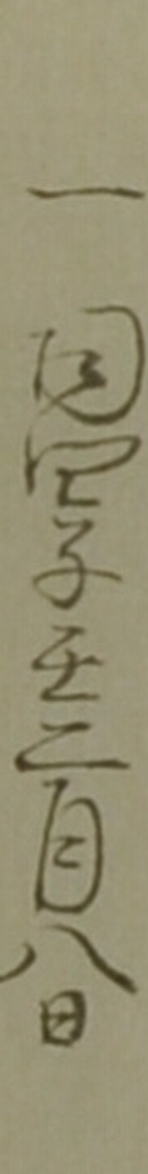一同四子壬二月八日
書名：無足諸士勤仕録（五）
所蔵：伊那市立高遠町図書館・合同会社AMANE
